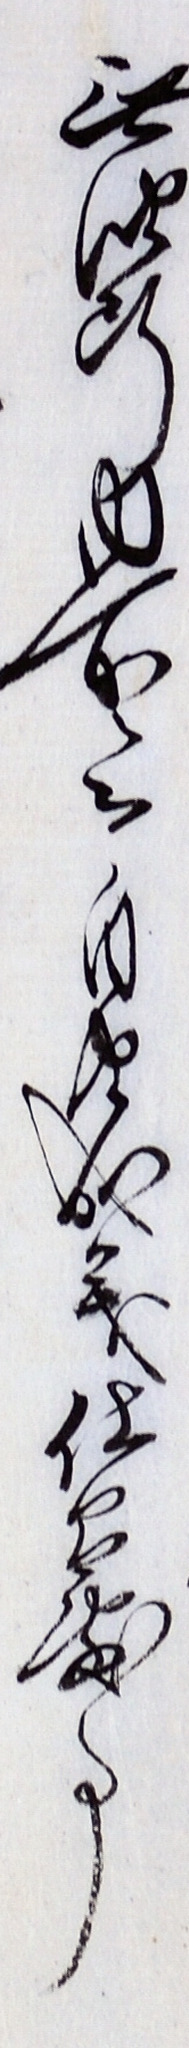無御断内所候而自由成義仕間敷事
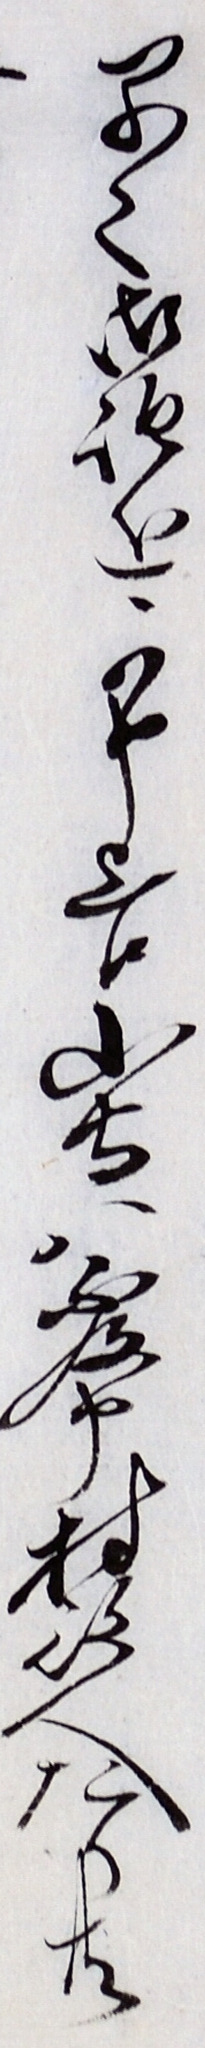早々御註進可申上候山守ハ不及申村役人たり共
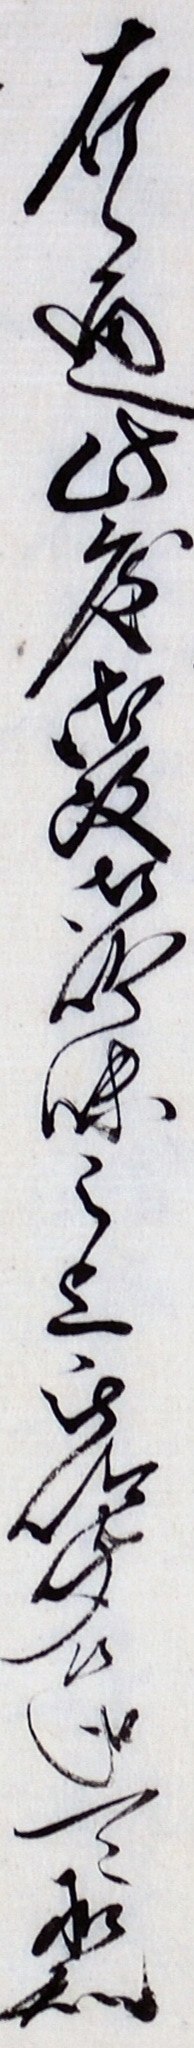右之通此度御改御吟味之上被仰聞候趣一々承知
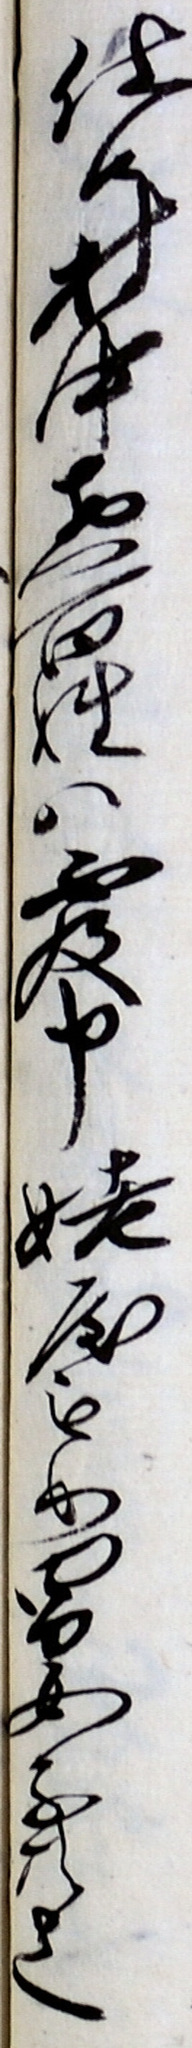仕候村中惣百姓ハ不及申姥やもめ男女子共迄
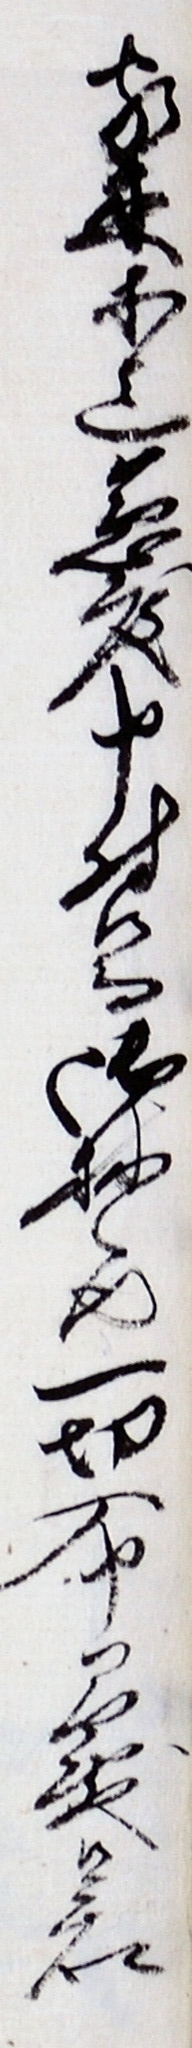家来等迄急度申付候而御林之内一切入申間敷候若
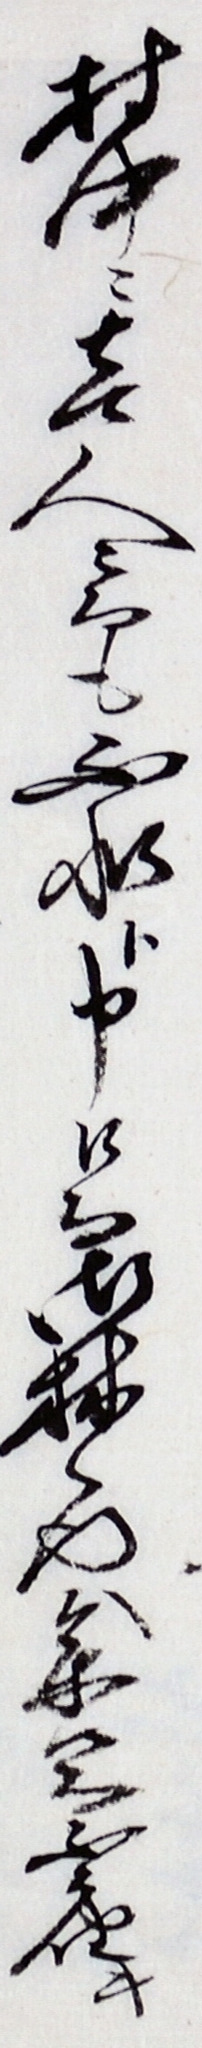村中ニ壱人ニ而も不承ト申候而御林之内へ参候而不届キ
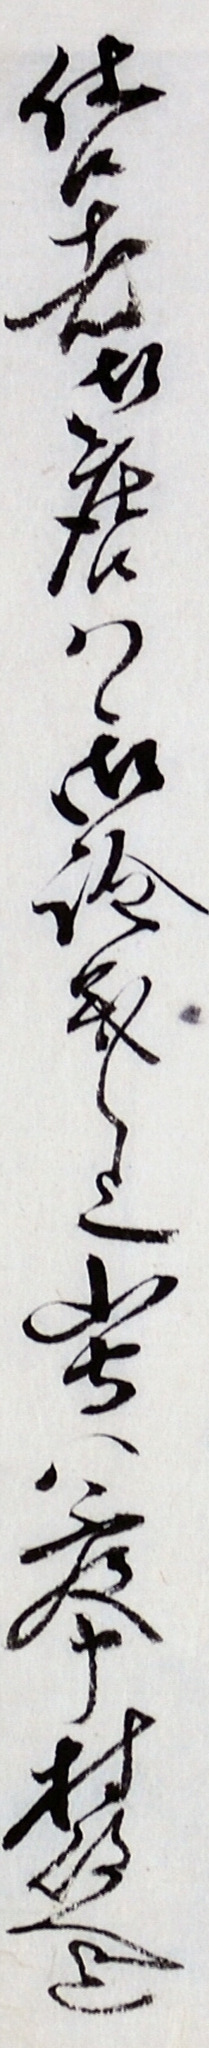仕候者御座候ハヽ御詮義之上山寺ハ不及申村役人迄
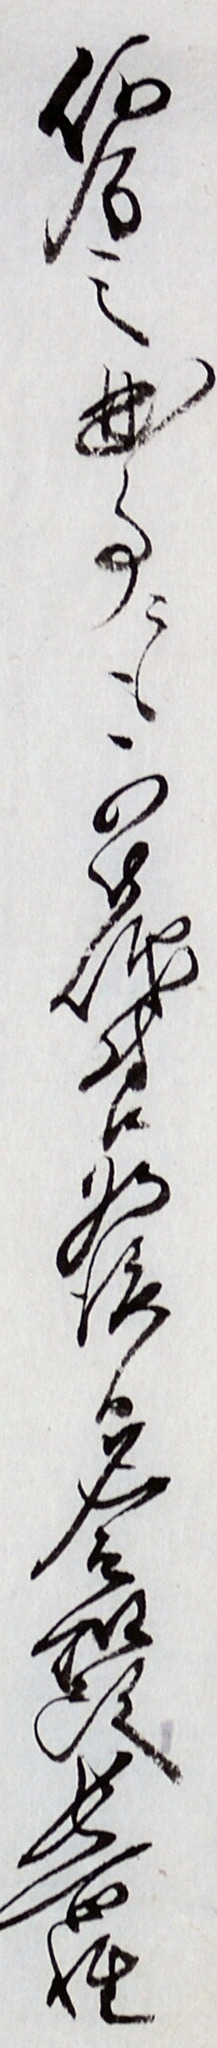何分之曲事ニも可被仰付候為後日名主組頭長百姓
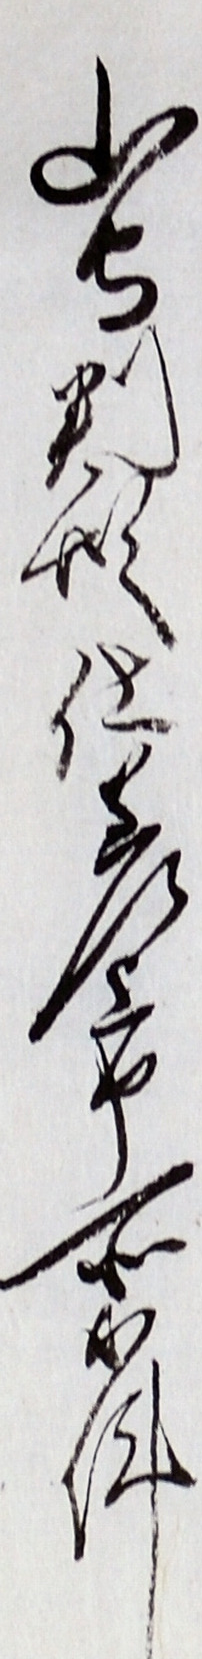山守判形仕差上申所如件
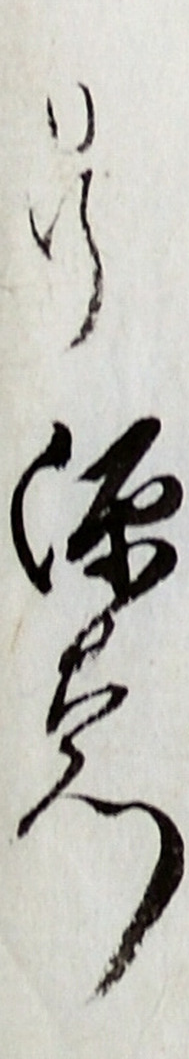同断源右衛門

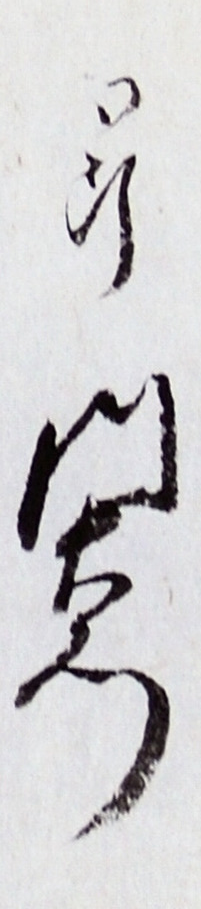同断門右衛門
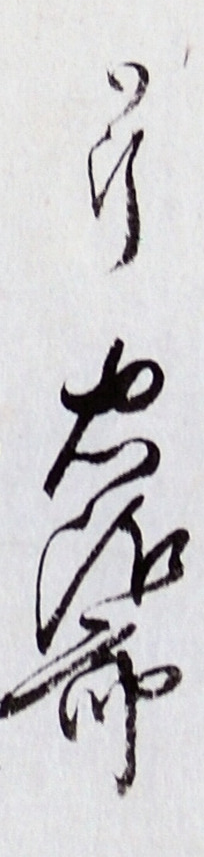同断忠治郎
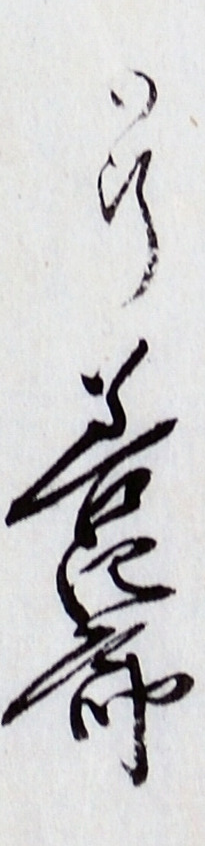同断善四郎
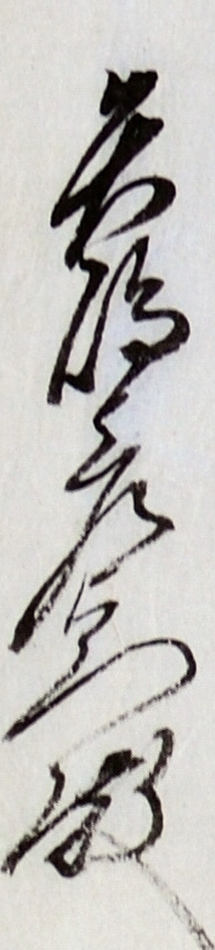矢嶋彦右衛門殿

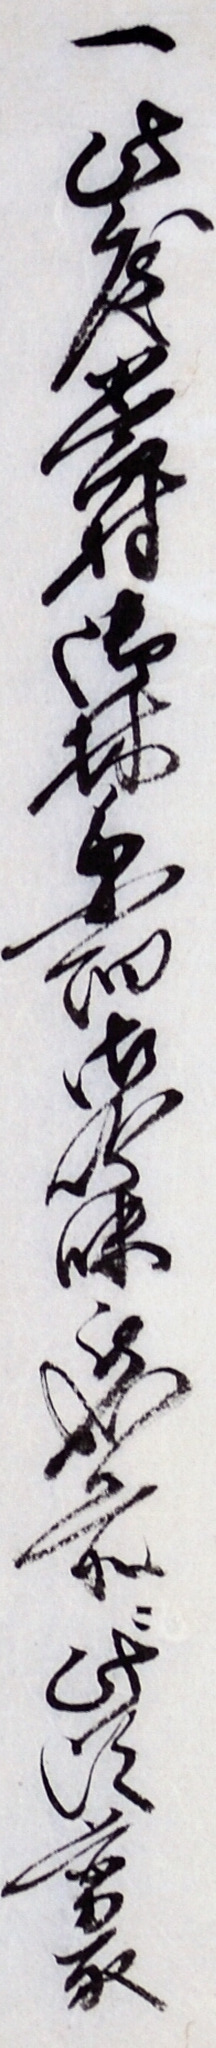一此度当村御林委細御吟味被成候所ニ此頃剪取
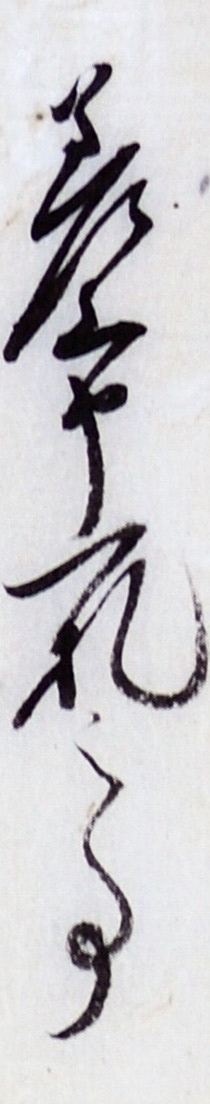差上申一札之事
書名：御林御竹藪証文控
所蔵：伊那市立高遠町図書館・合同会社AMANE
